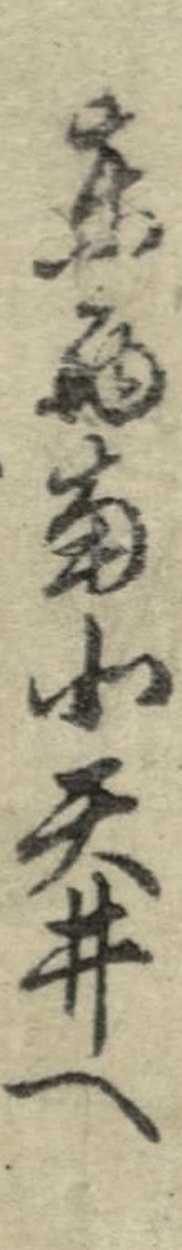東西南北天井へ
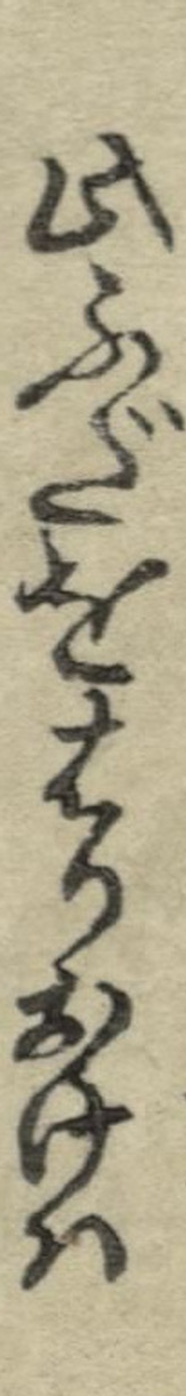此ふだをはりおけは
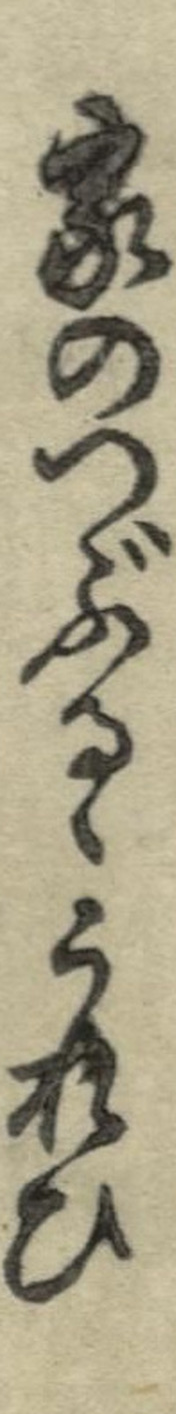家のつぶるゝうれひ
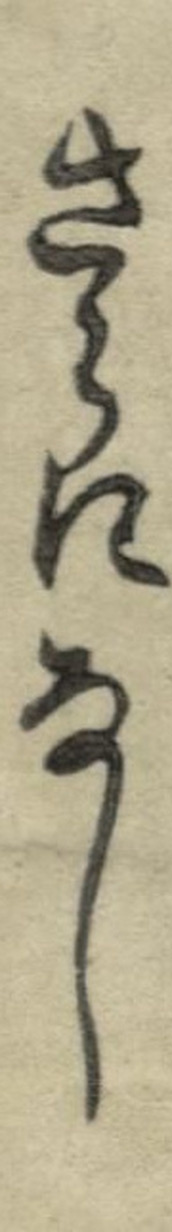さらになし
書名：鯰退治
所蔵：東京大学地震研究所図書室 Earthquake Research Institute Library, The University of Tokyo, JAPAN
